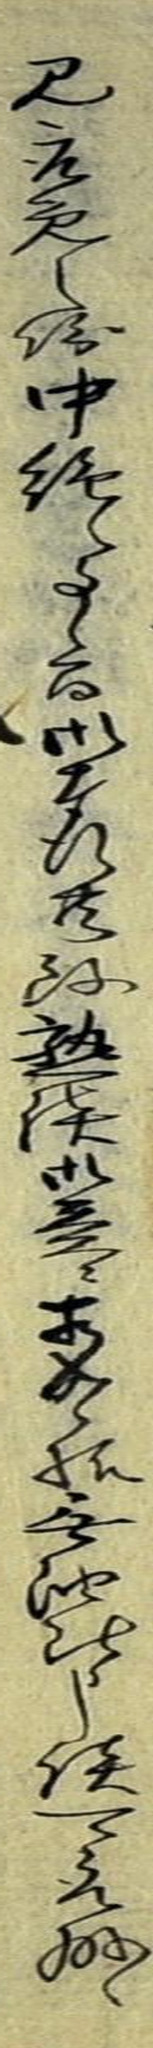見取免之儀中絶之事候間御奉行共致熟談御益に相成候様無油断申談可取扱候
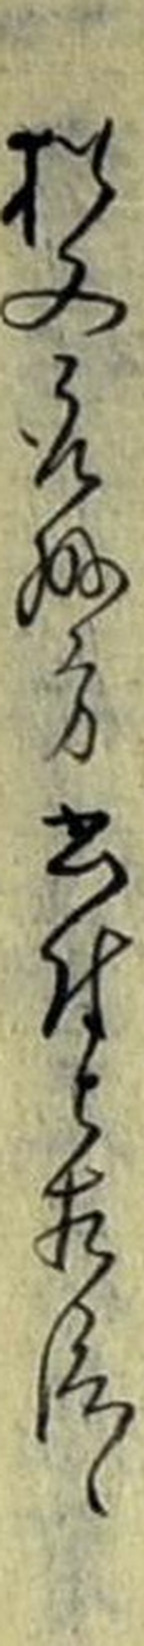猶又取扱方書付被相渡候

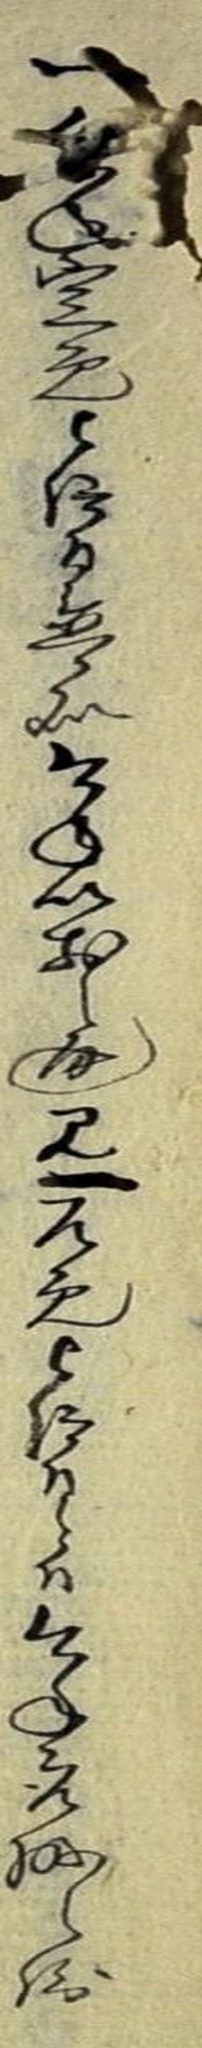一近年定免被仰付置候処今年以前之通見取免被仰付候に付今年取扱之儀
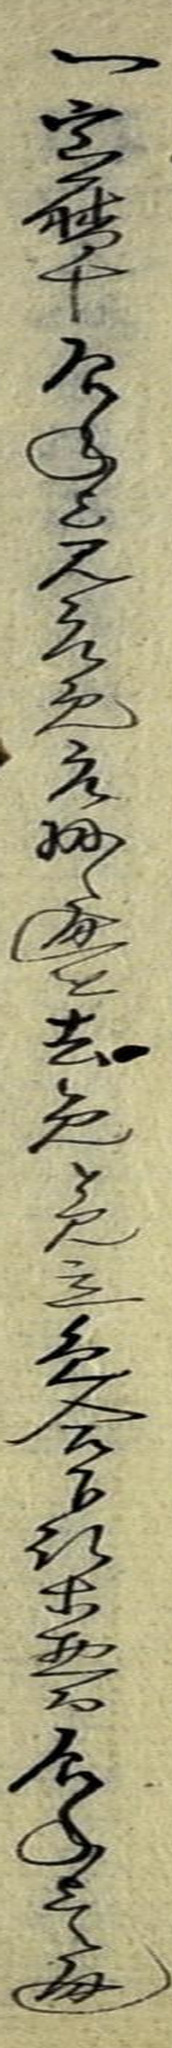一宝暦十辰年迄見取免取扱之通を去免と見立免合下行等惣而辰年迄之通
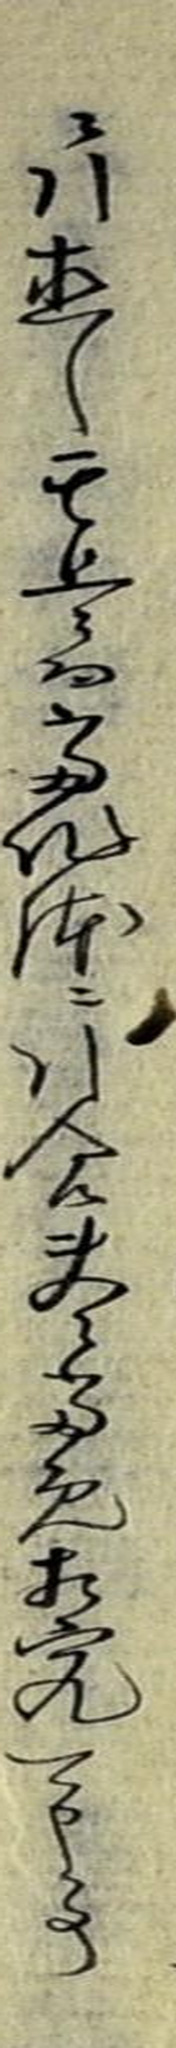に引直し其上に而当作体に引合夫々当免相究可申事
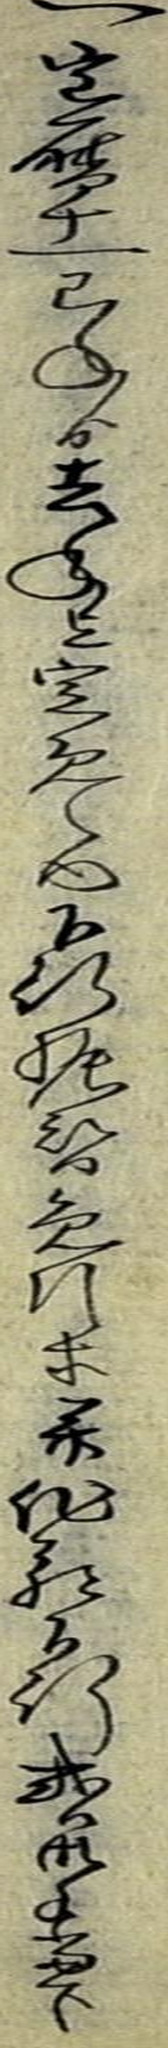一宝暦十一巳年ゟ去年迄定免之内下行振替免引等并作難下行或は御手当下
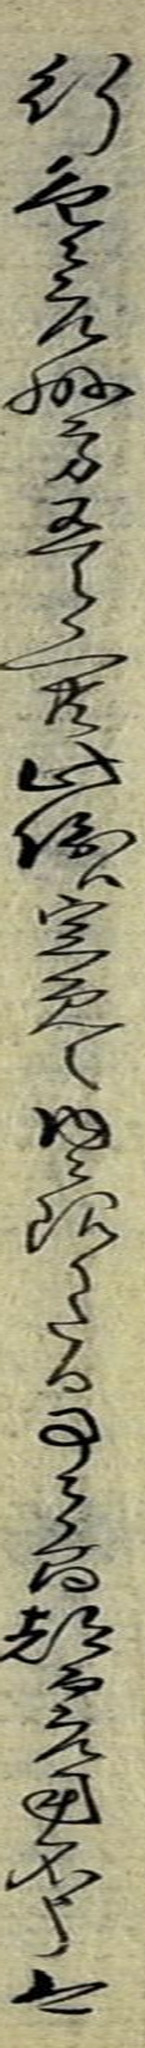行毛に取扱方有之候へ共此儀は定免之内に限りたる事に候間都而取用不申今
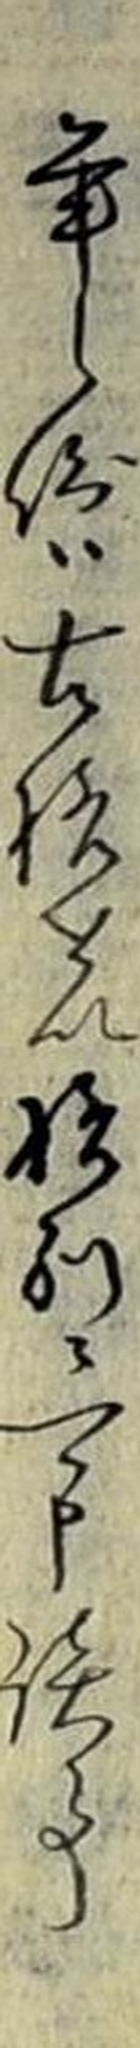年之儀は古格を以格別に可申談事
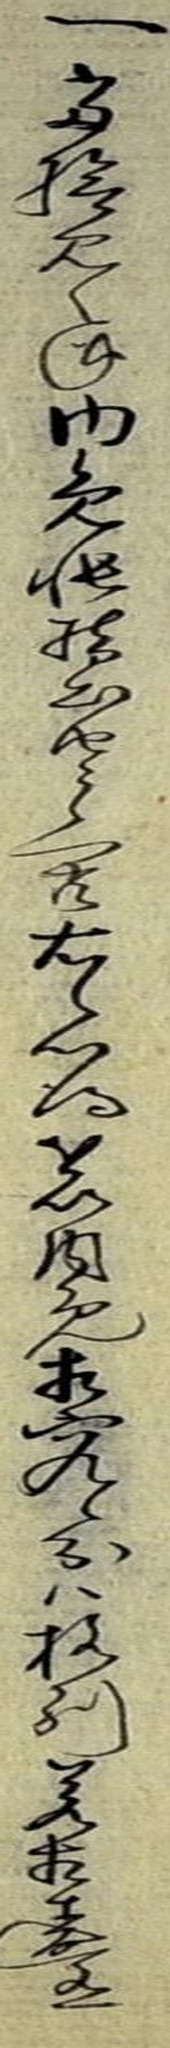一当検見之趣内免帳指出由に候へ共右之心得を以内免相究候分は格別若相違有
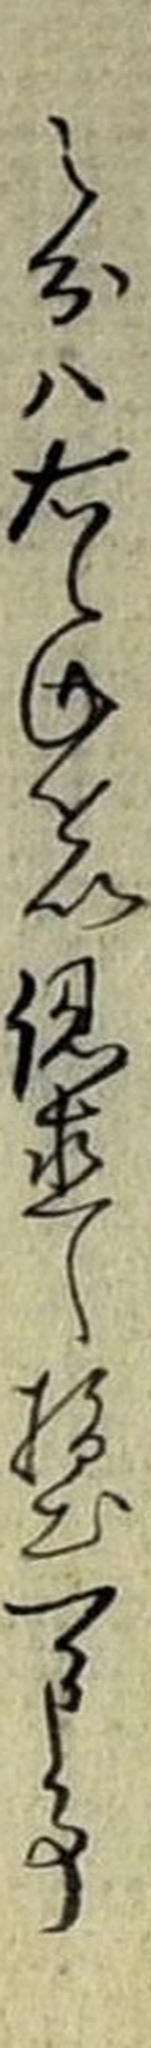之分は右之趣を以認直し指出可申事
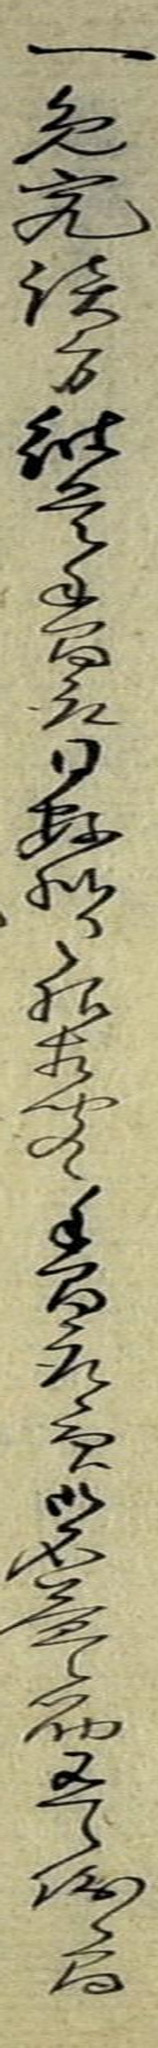一免究談方彼是手間取日数掛り候様相聞候手間取候而は御不益之筋有之儀候間
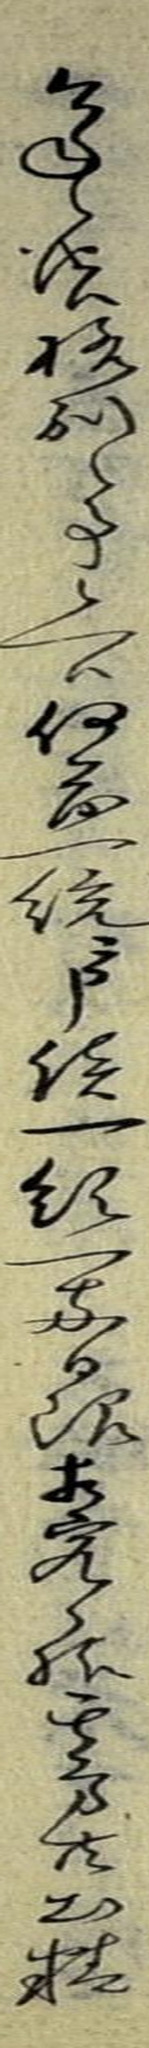今年之儀は格別之事候へは何茂一統に申談一領一両日限相究候様其方共出精
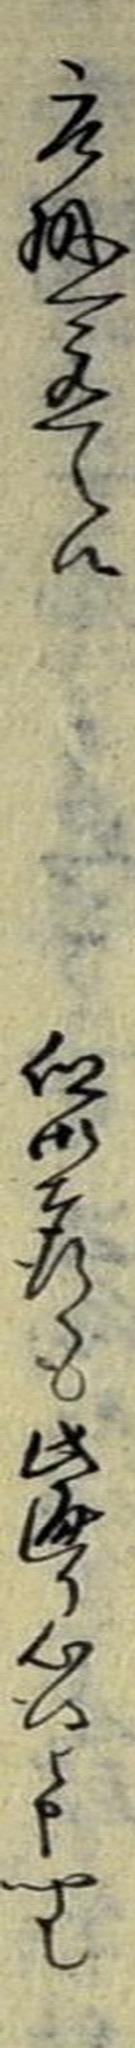取扱可有之候但御奉行へも此通り心得被申聞候
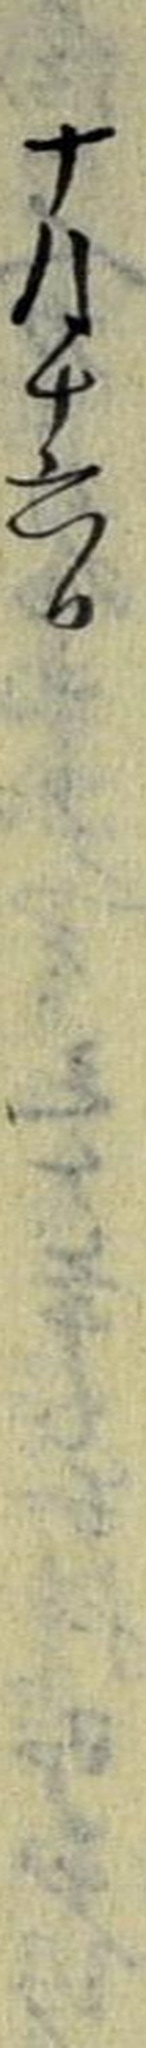十月十六日
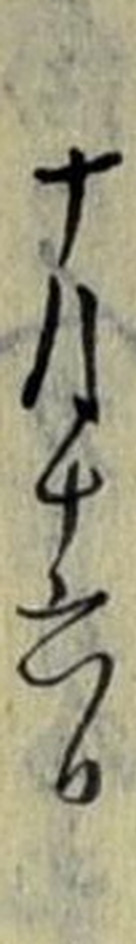十月十六日
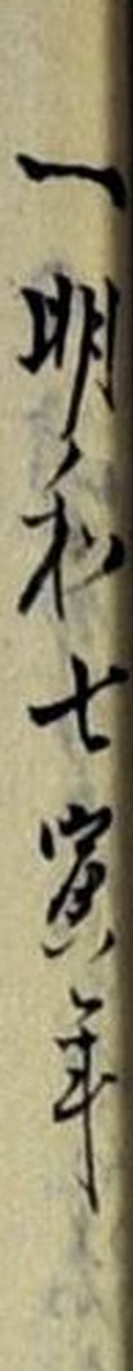一明和七寅年
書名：命令之部 二
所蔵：福井県文書館 Fukui Prefectural Archives
